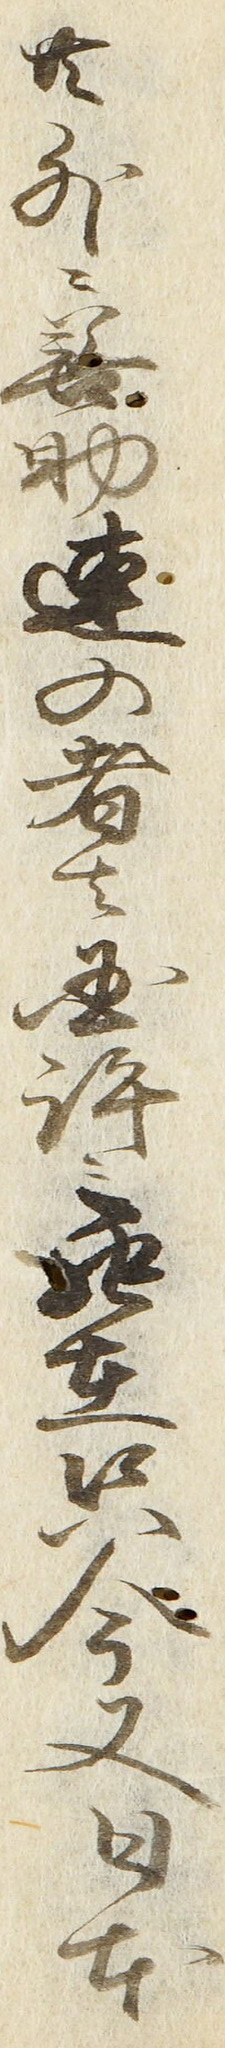共外ニ善助連の者は国許ニ罷在只今又日本
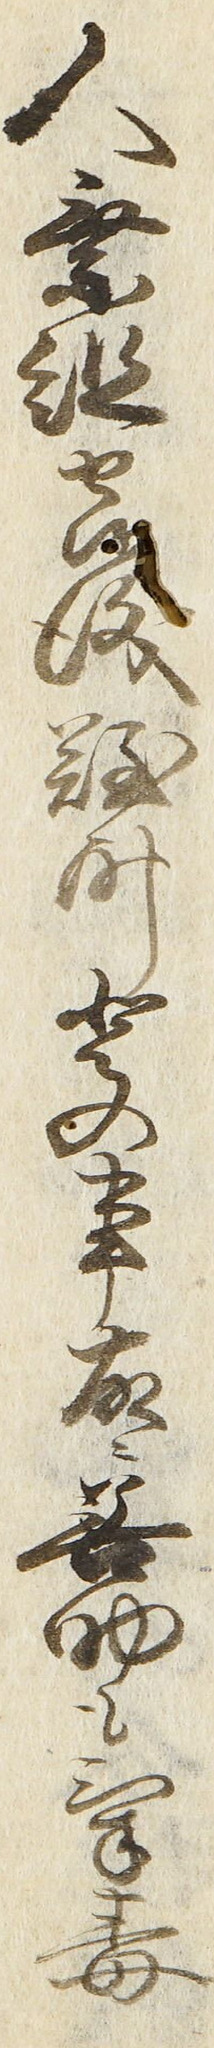人乗組せ候儀難叶との事故善助も気毒
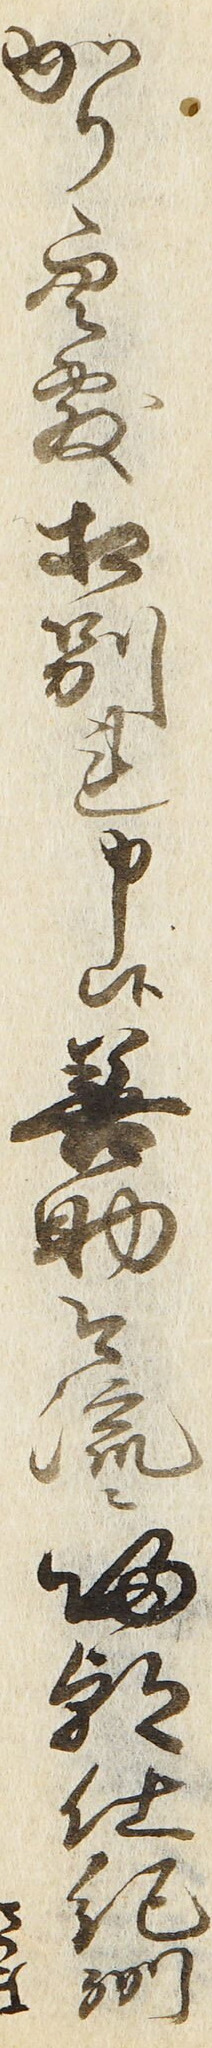かり空敷相別れ申候善助は流ニ帰朝仕紀州さま
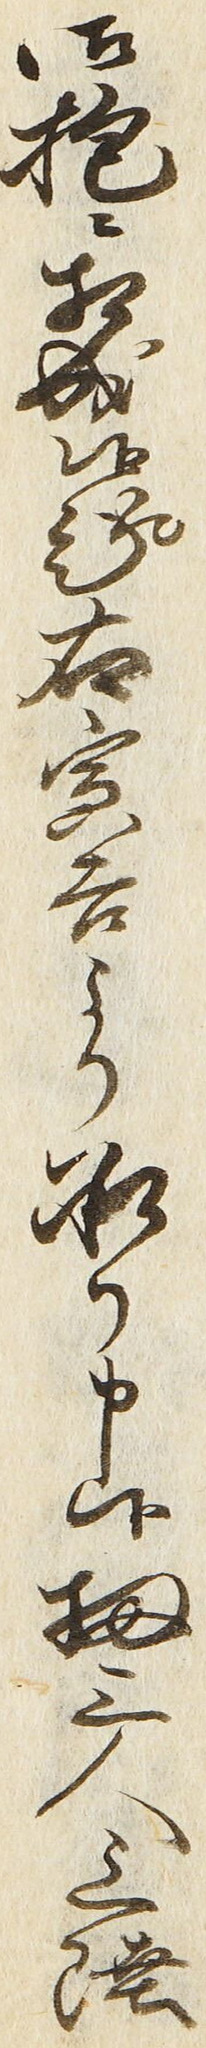御抱ニ相成候趣右寅吉より承り申候扨三人上陸
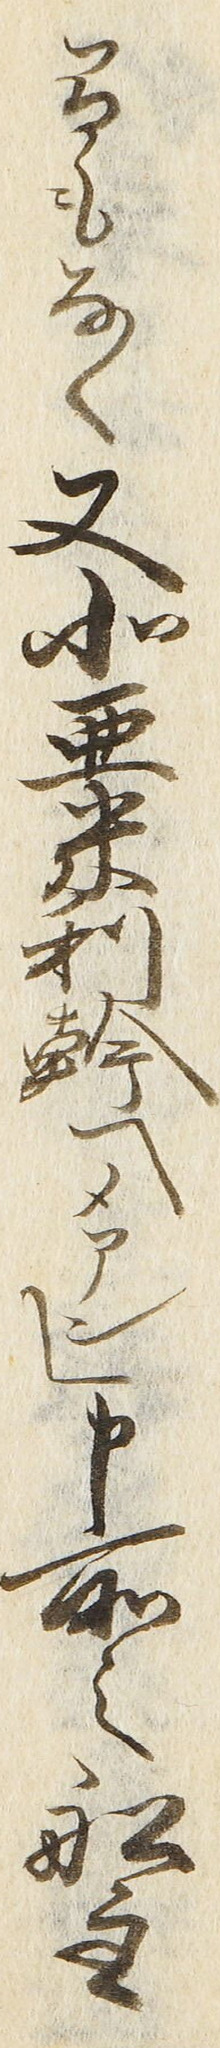間もなく又北亜米利幹「メアン」申所之舟主
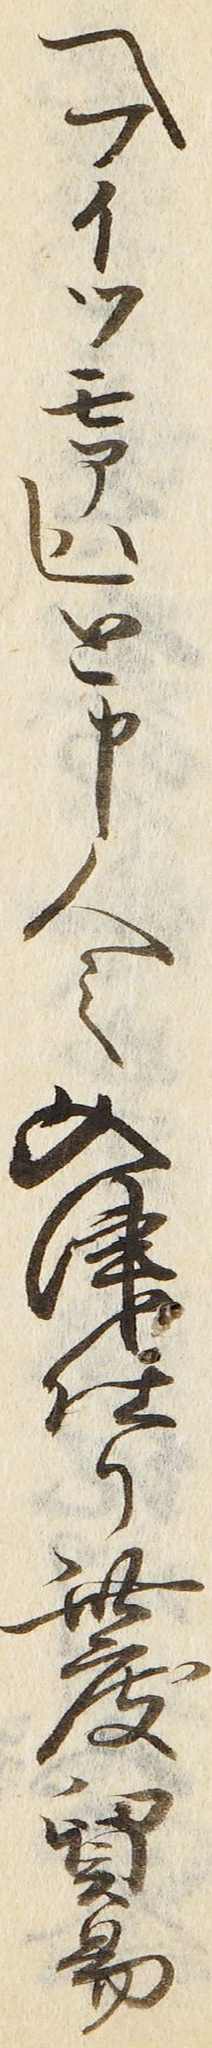「フイツモアハ」と申人之入津仕り此度貿易
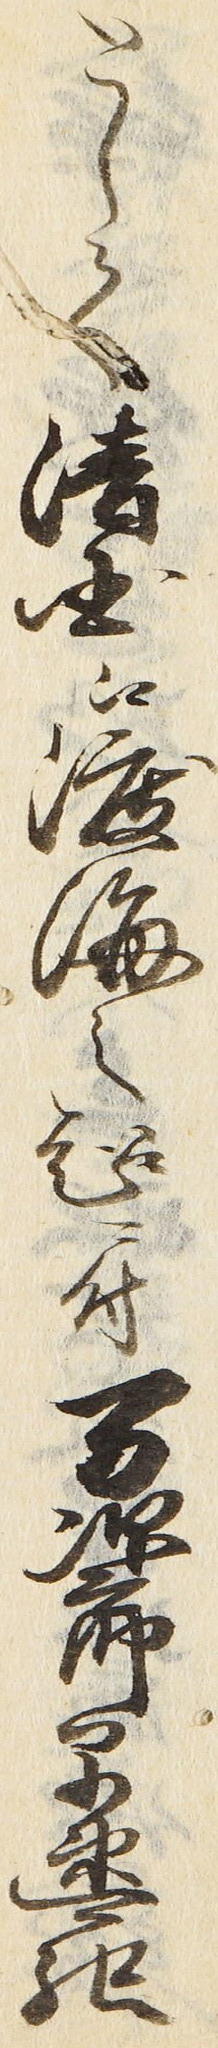として清国江渡海之趣ニ付万次郎早速罷
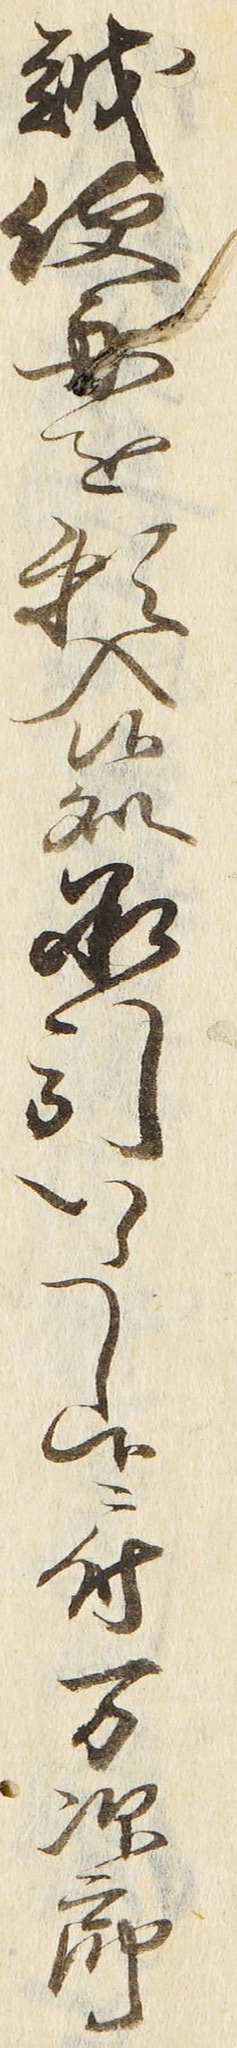越便舟を頼入候処承引いたし候ニ付万次郎
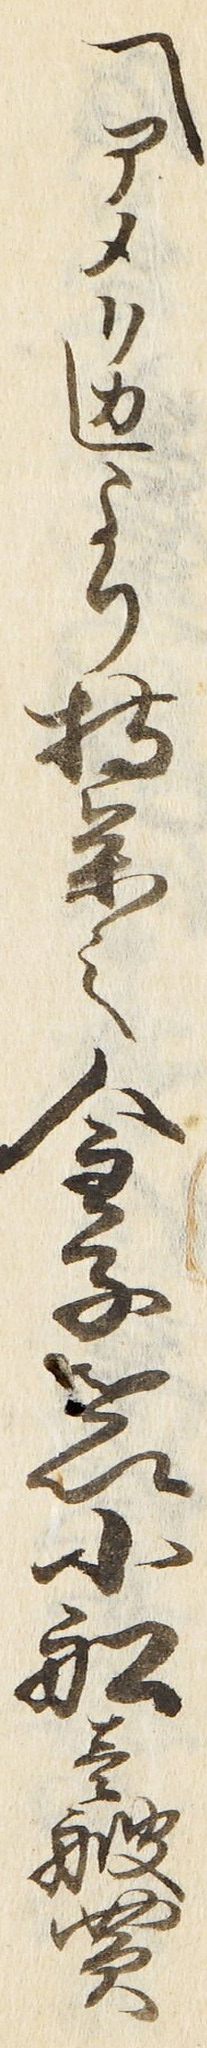「アメリカ」より持参之金子を以小舩壱艘買
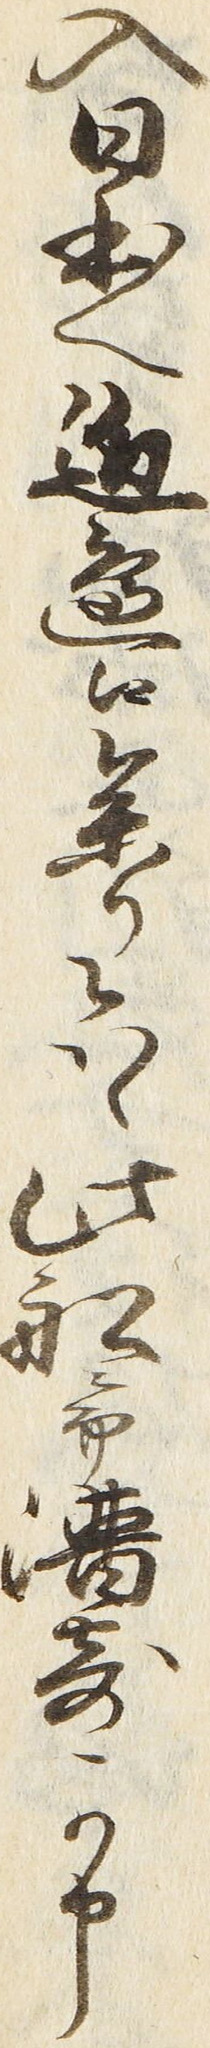入日本へ近邊江参り候ハヽ此舩ニ而漕寄可申
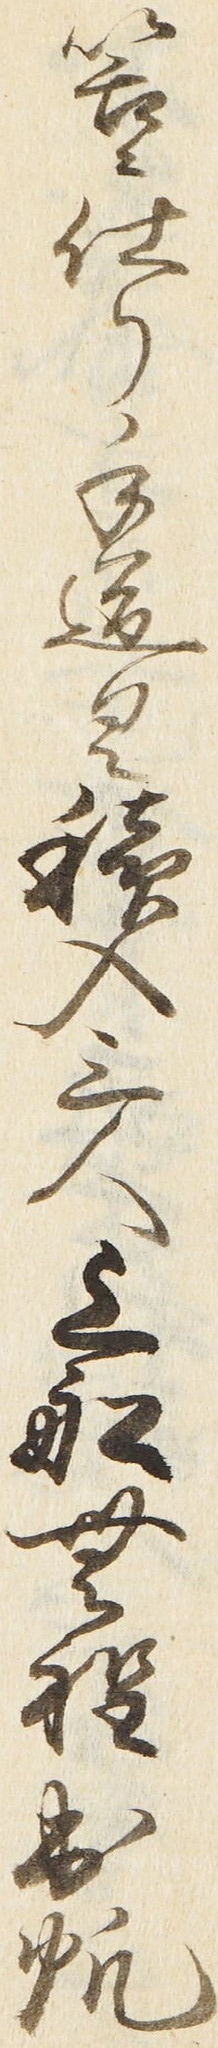筈ニ仕り手道具積入三人上舩無程出帆
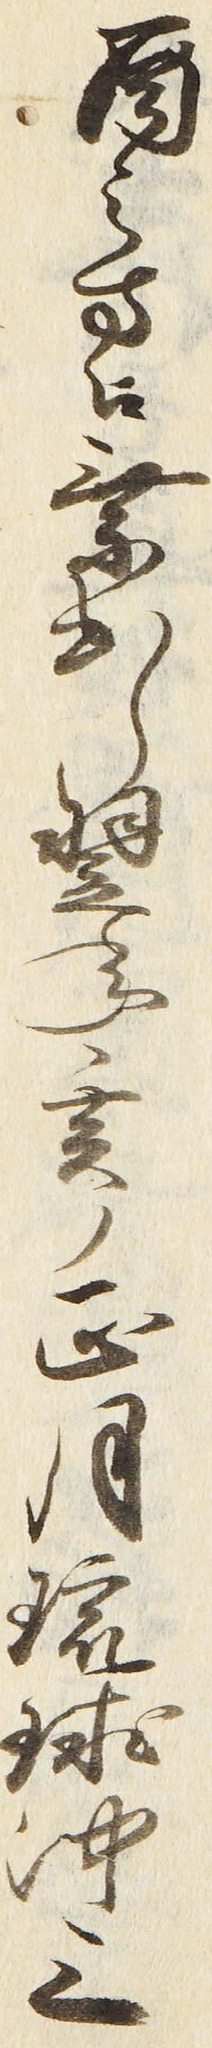酉之方江乗出し翌年亥ノ正月琉球沖三
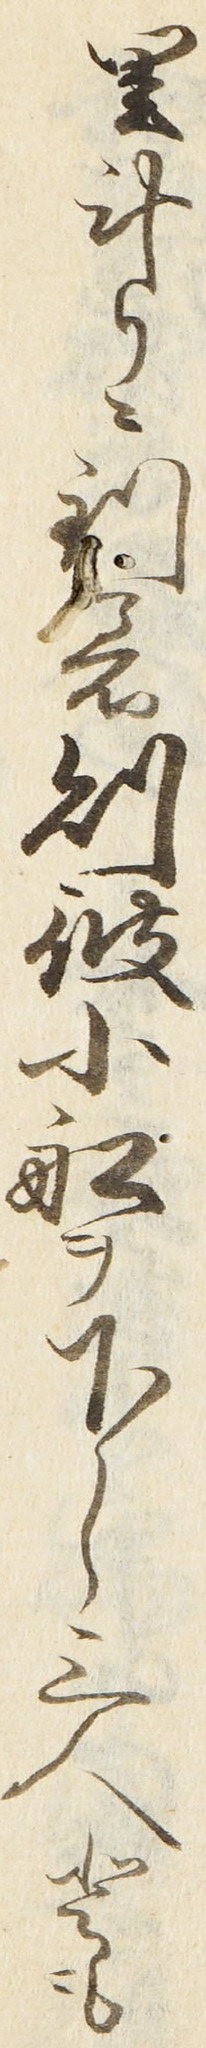里斗りニ到着則彼小舩ヲ下し三人とも
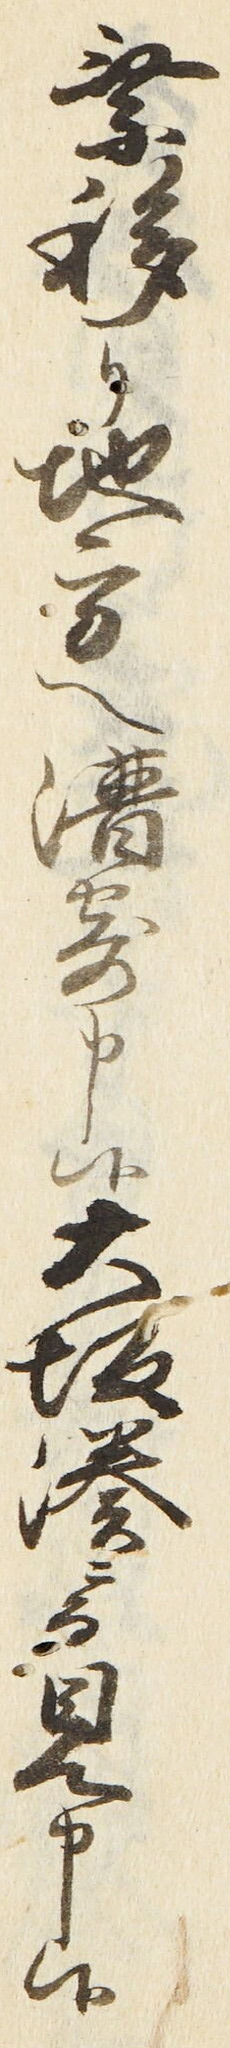乗移り地方へ漕寄申候大坂湊ニ而見申候
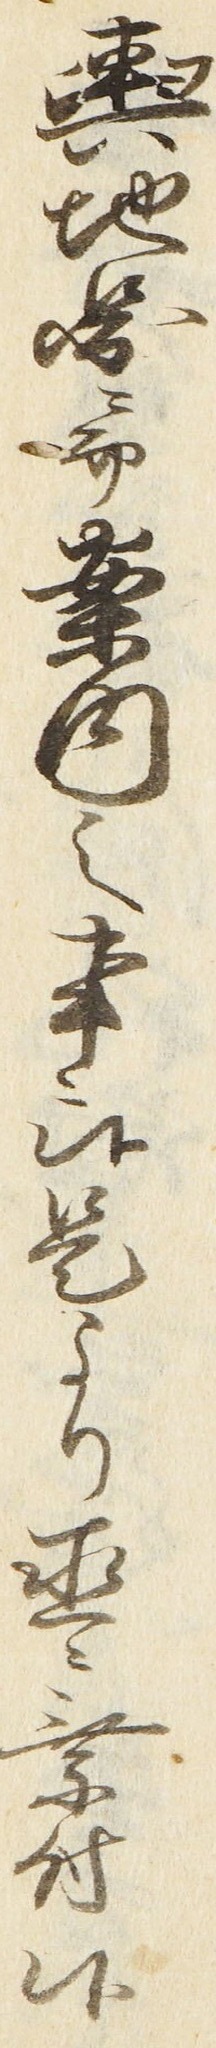輿地圖ニ而案内之事ニ候是より直ニ乗付候
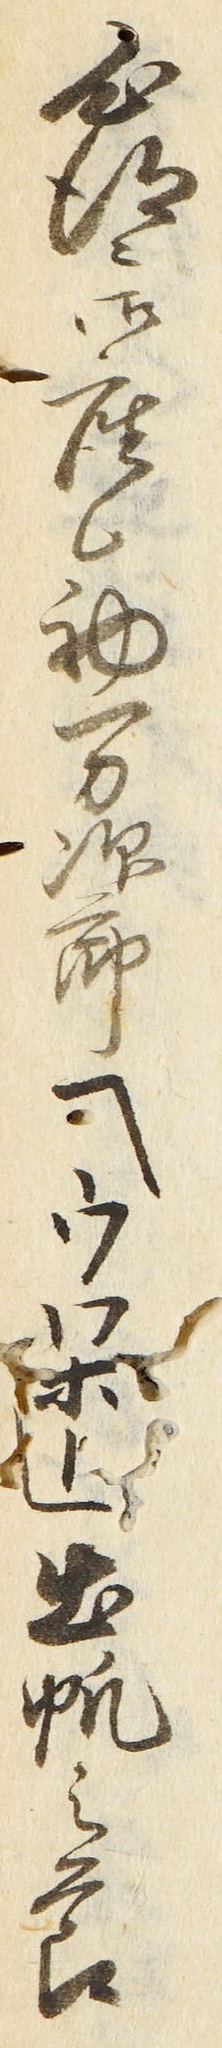心得ニ御座候初万次郎「ウワホー」出帆之節
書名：漂客談寄
